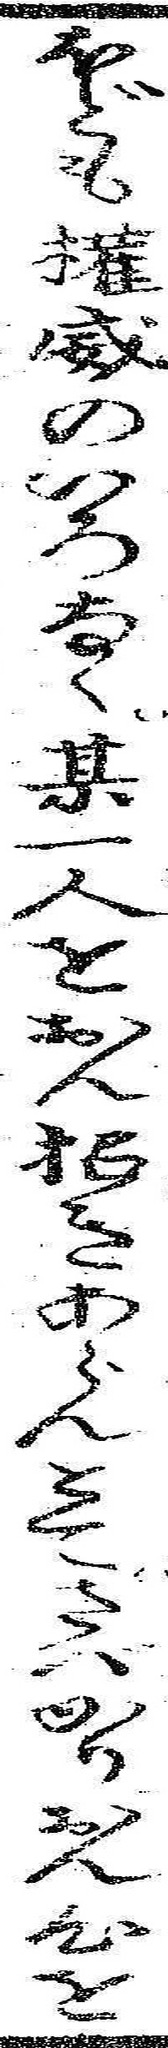ほども権威のいろなく。某一人をおん招きあらんとて。さばかりおん心を
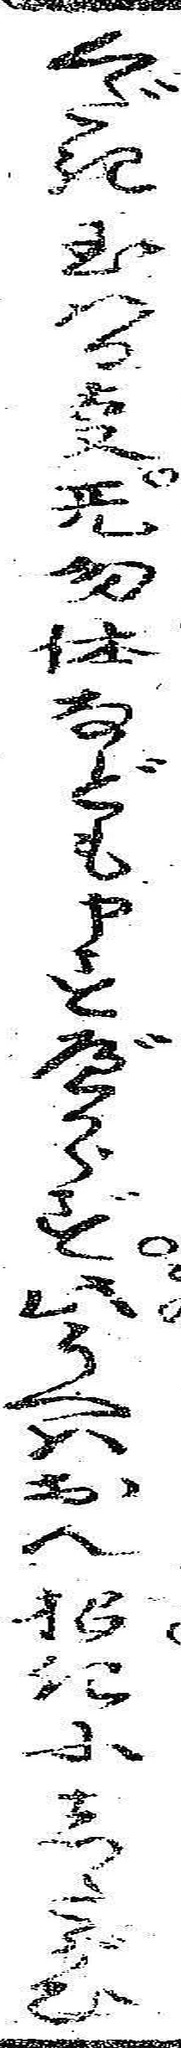くだき玉はる事。無勿体なども申すべからず。此うへはおん招きにしたがひ
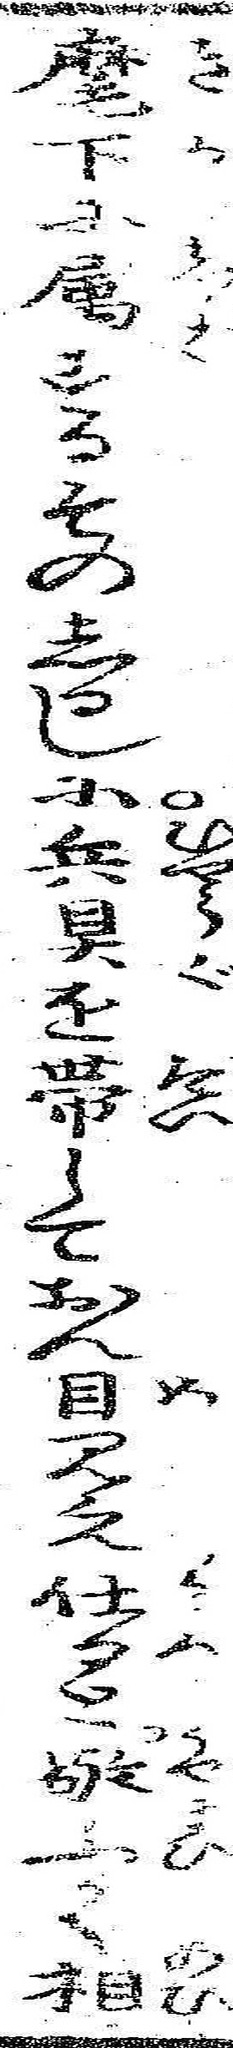麾下に属するそのしるしに。兵具を帯しておん目見え仕ると。敬ふかく相
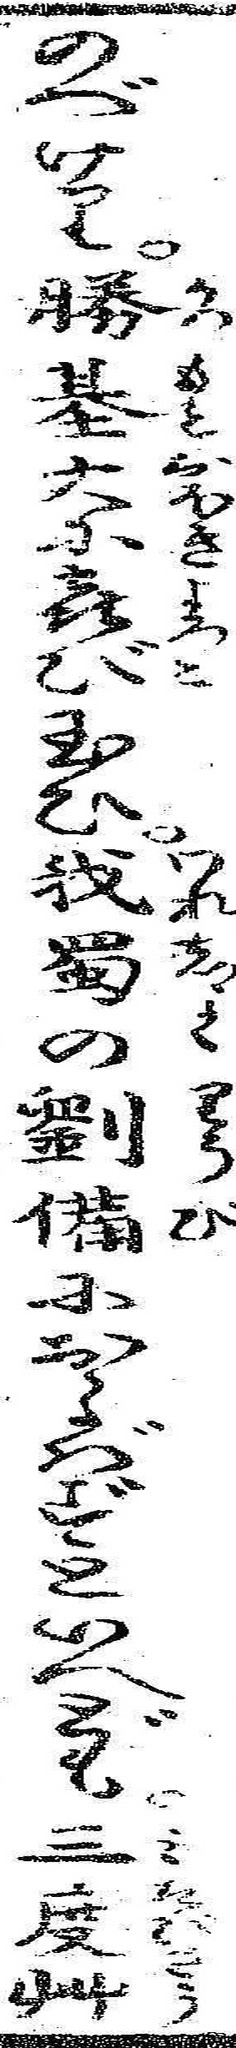のべけり。勝基大に喜び玉ひ。我蜀の劉備におよばずといへども。三度艸
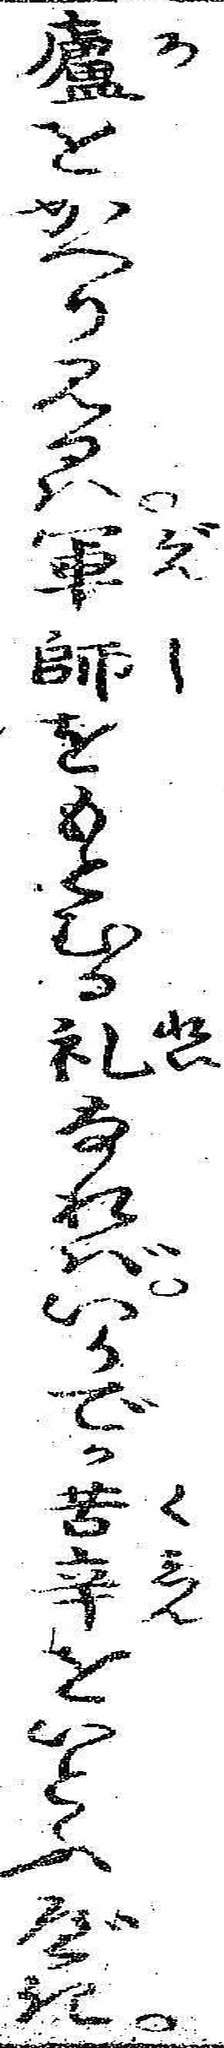盧をかへり見るは。軍師をもとむる礼なれば。いかでか苦辛をいとふべき。
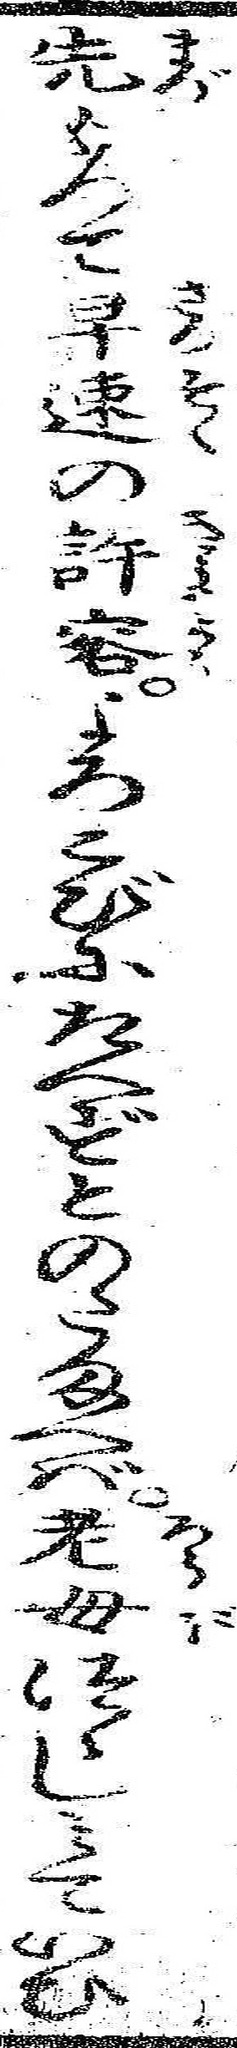先もつて早速の許容。よろこびにたへずとのたまへば。老母つゝしみていひ
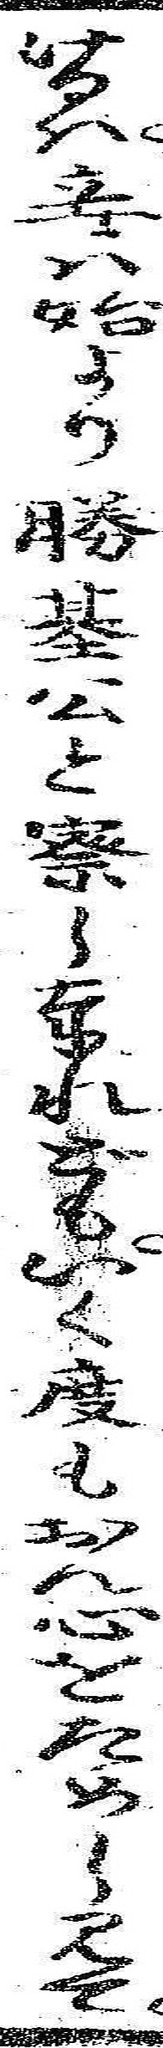けるは。妾は始より勝基公と察し奉れども。いく度もおん心をためし見て。

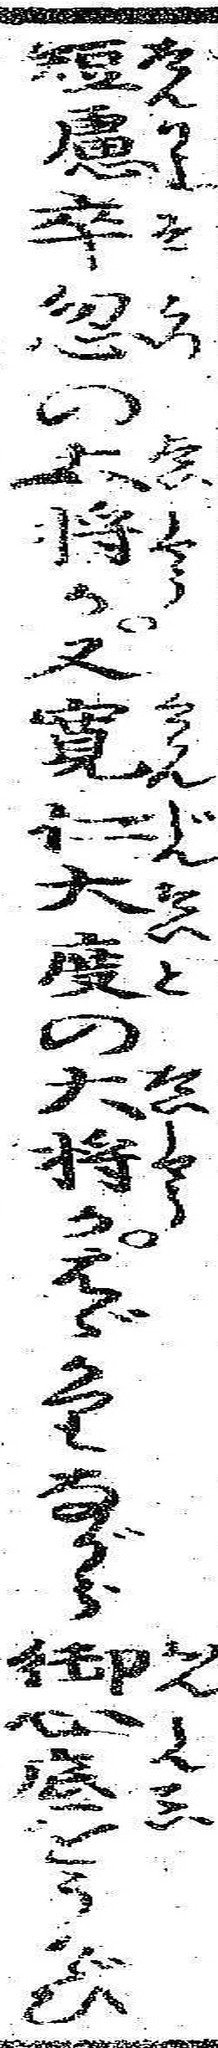短慮卒忽の大将か。又寛仁大度の大将か。はゞかりながら御心底をうかゞひ
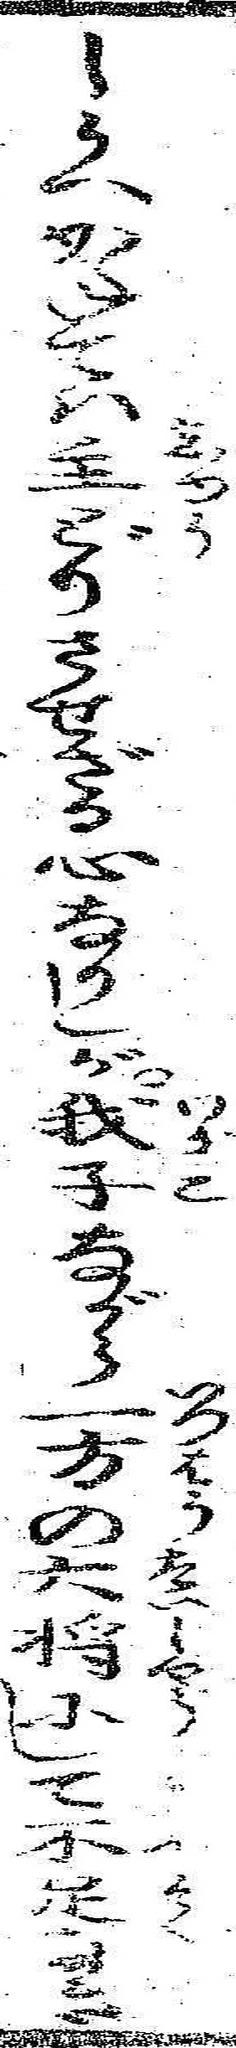しうへかねては主どりさせざる心なりしが。我子ながら一方の大将にして不足なき
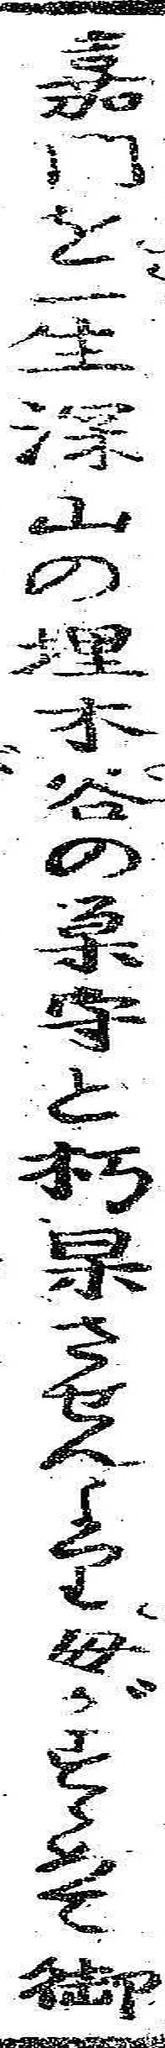嘉門を。一生深山の埋木。谷の巣守と朽果させんより。母がすゝめて御
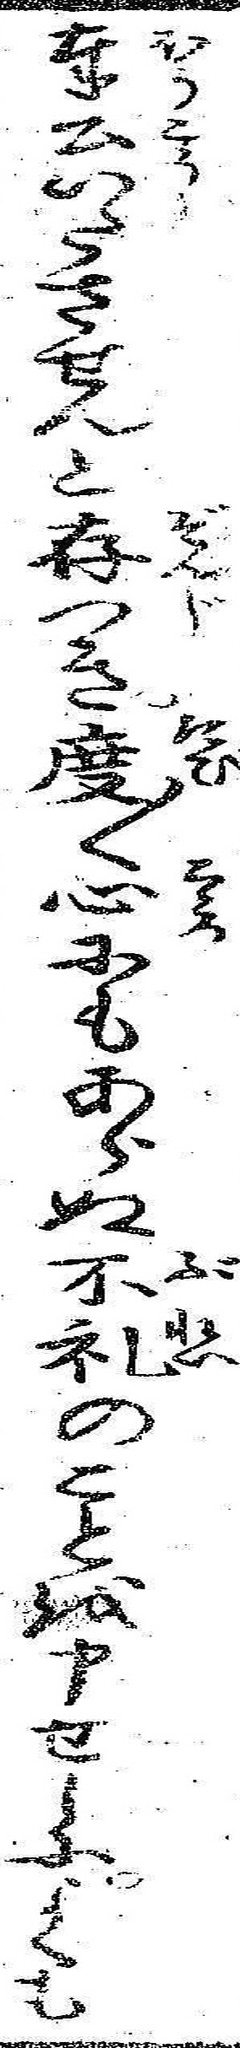奉公いたさせんと存つき。度心にもあらぬ不礼のことを申せしに。よくも
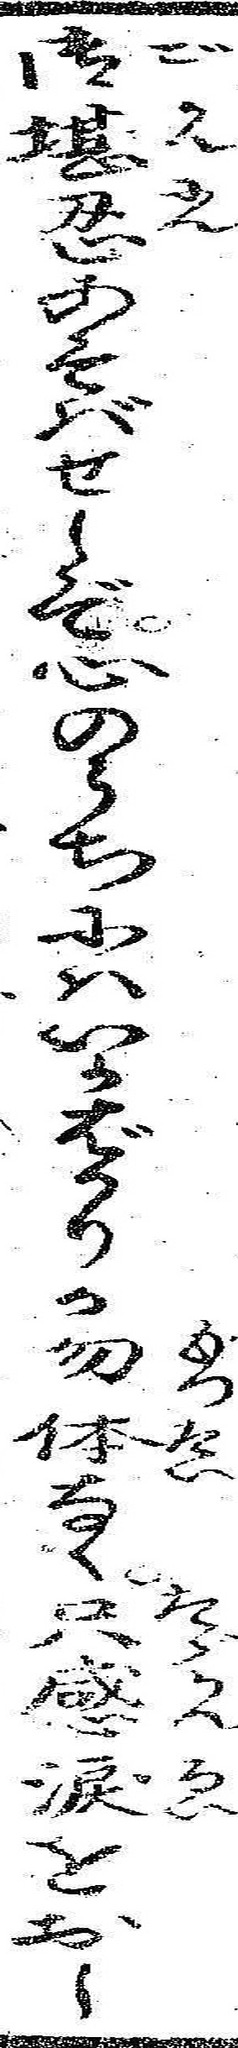御堪忍あそばせしぞ。心のうちにはいかばかりか勿体なく。只感涙をおし
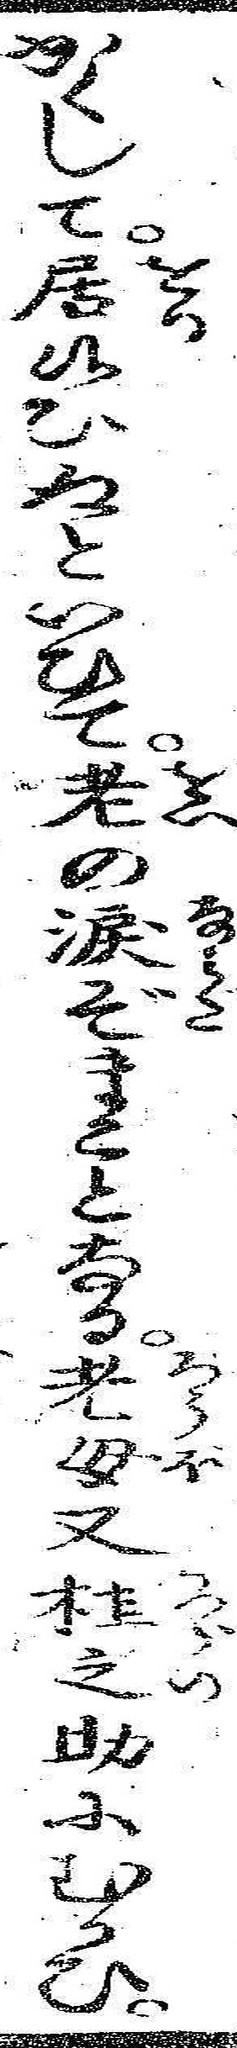かくして。居候ひぬといひて。老の涙ぞまことなる。老母又桂之助にむかひ。
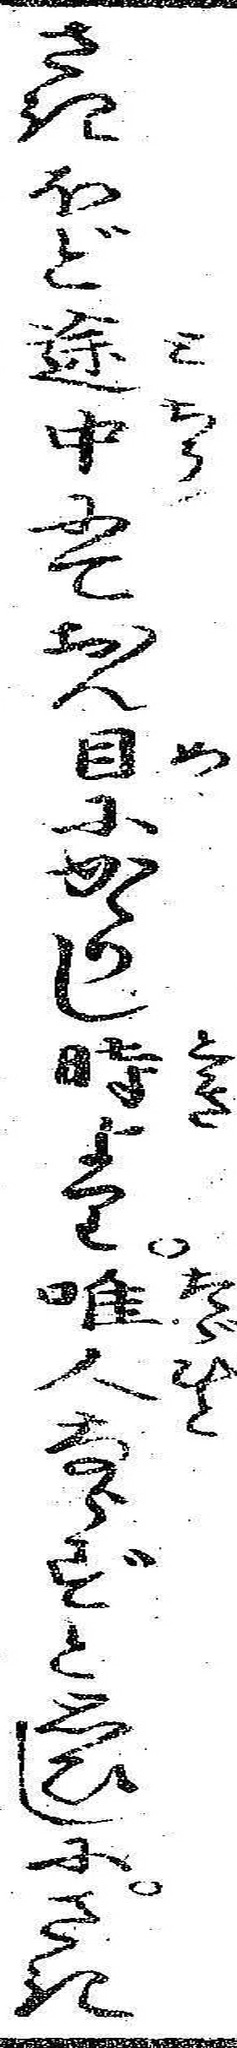さきほど途中にておん目にかゝりし時より。唯人ならずと思ひしに。さき
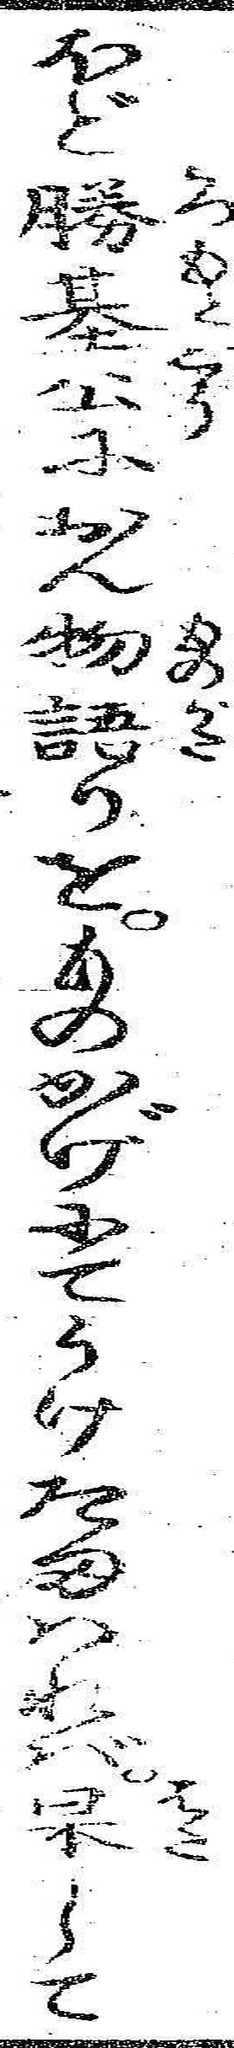ほど勝基公におん物語りを。ものかげにてうけたまはれば。果して
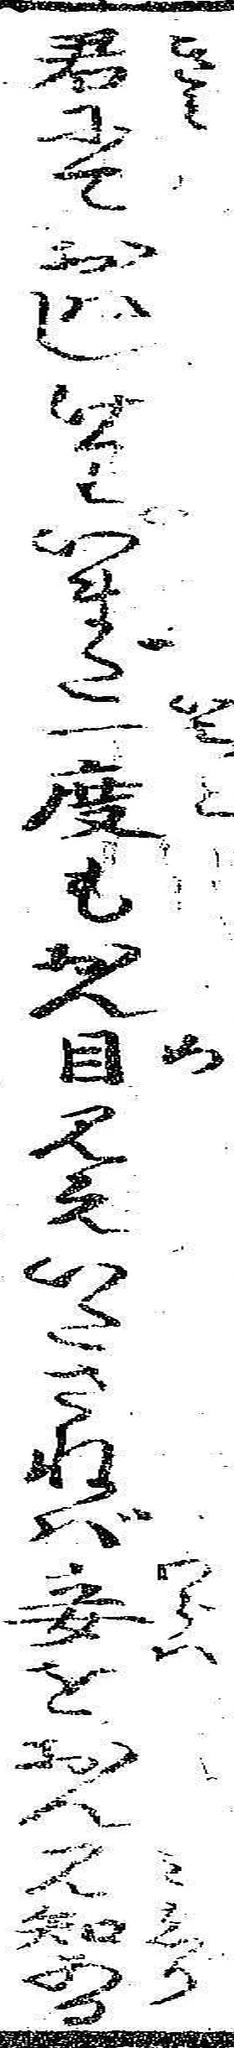君にておはしけり。いまだ一度もおん目見えいたさねば妾をおん見知ある
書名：昔話稲妻表紙
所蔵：国文学研究資料館
